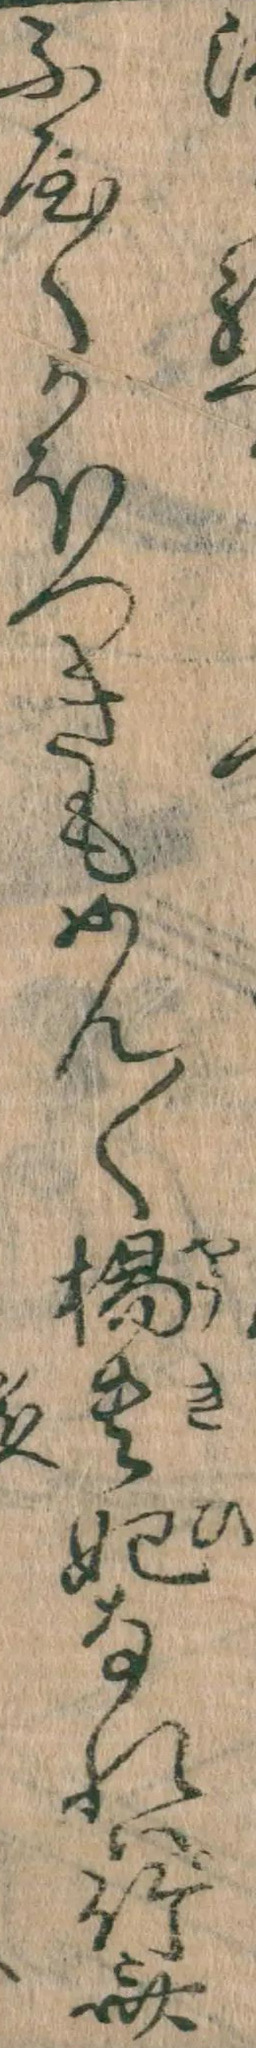ふやくかほつきもめん〳〵楊貴妃なれは、竹斎
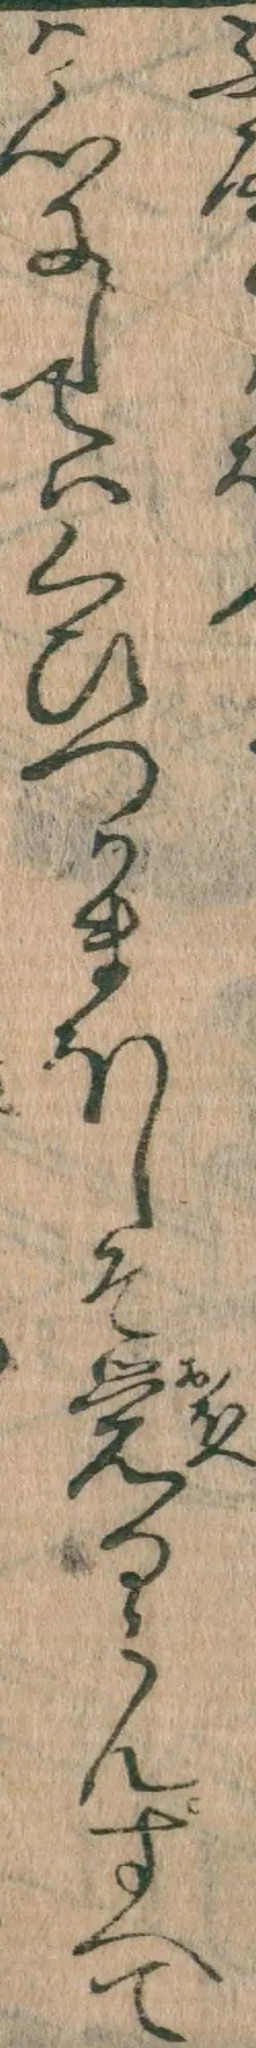か心にしてはくひつかまほしそ覚るらん。すへて
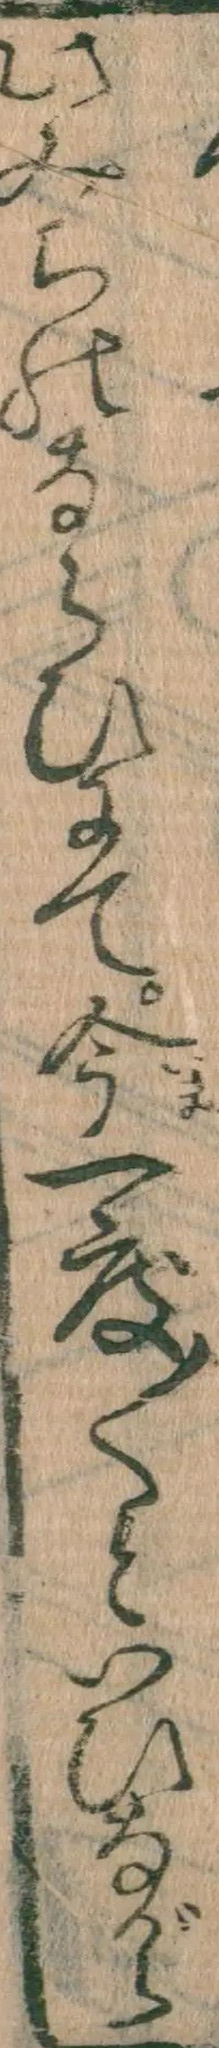此みちのならひにて。今一度〳〵といひながら
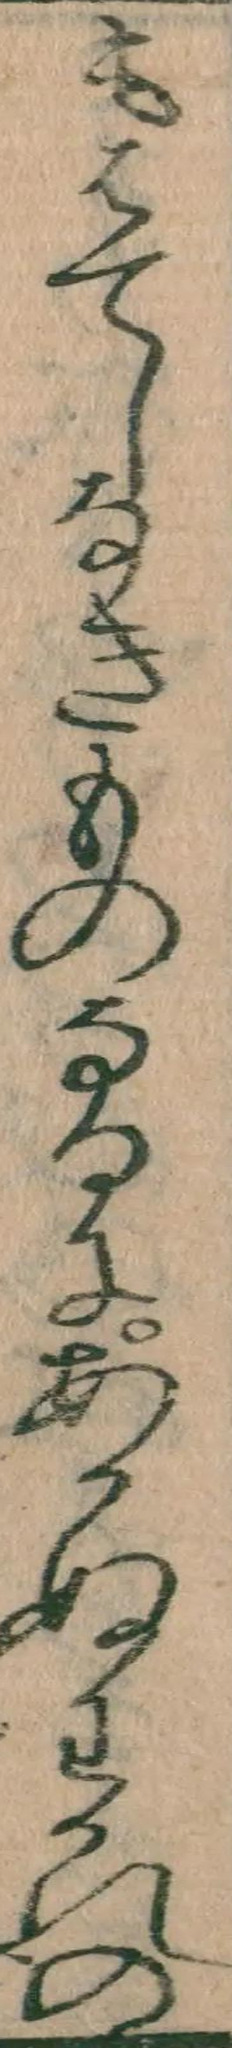もはてしなきものなるに。あかぬわかれの
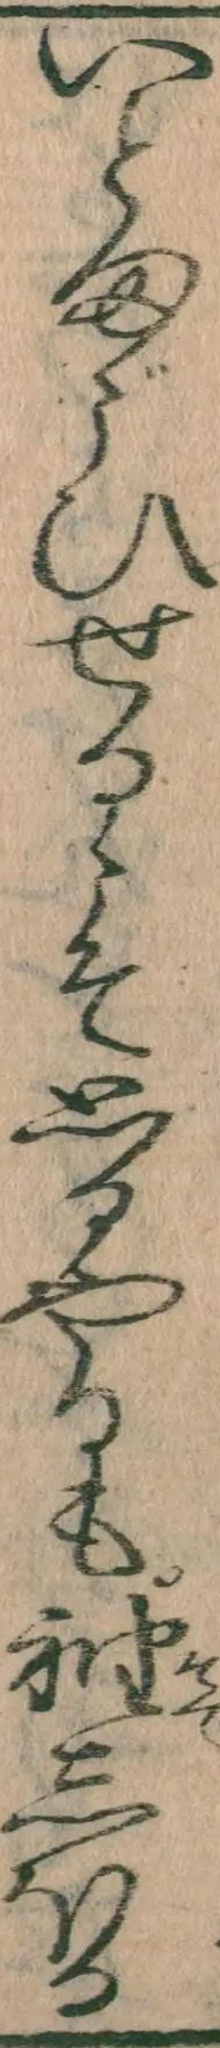いとまごひせるこそ思ひやるも。袖しほる
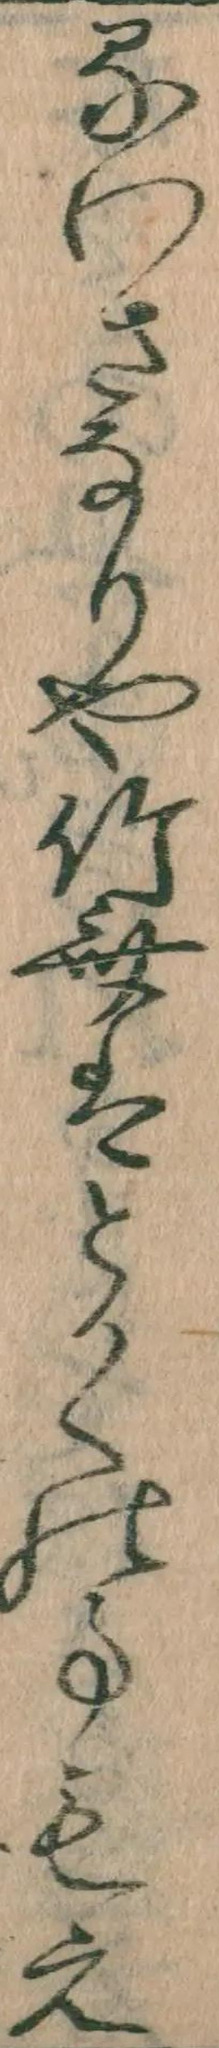るわさなりや竹斎はとかくの事もえ
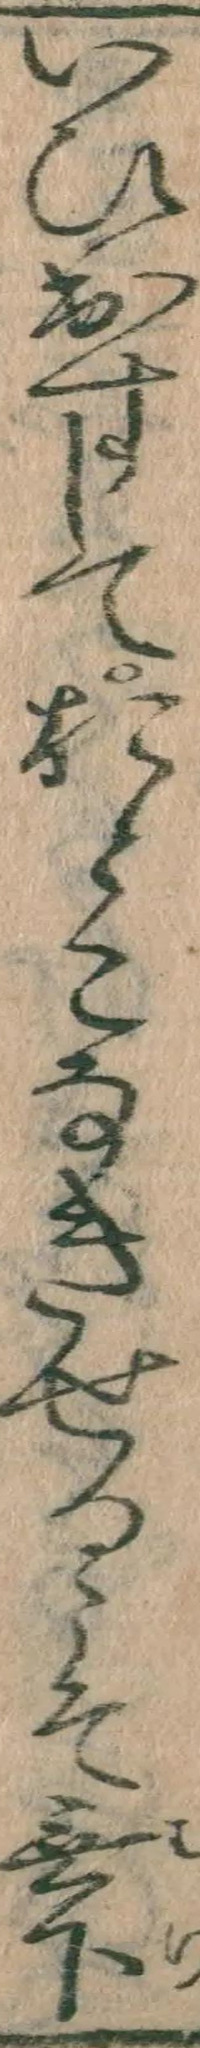いひ出すして。おとこなきせるこそ無下
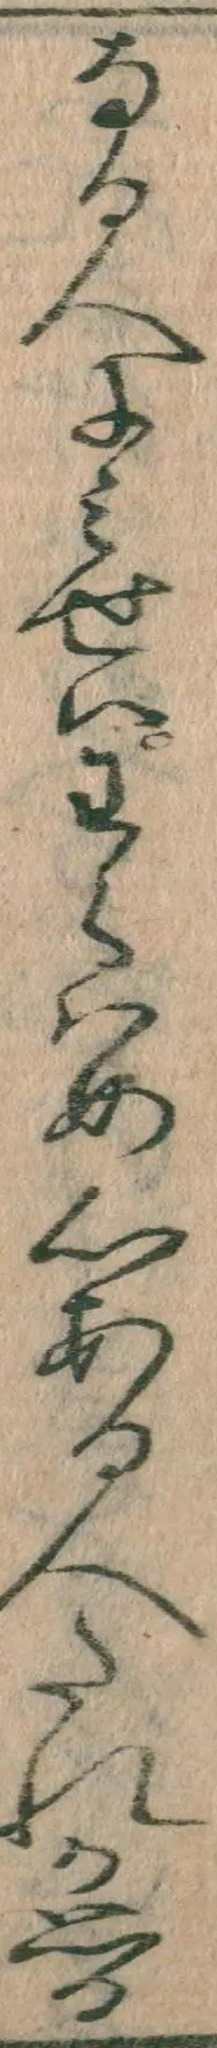なる人にみせは。わらはめ心ある人たれか思ひ
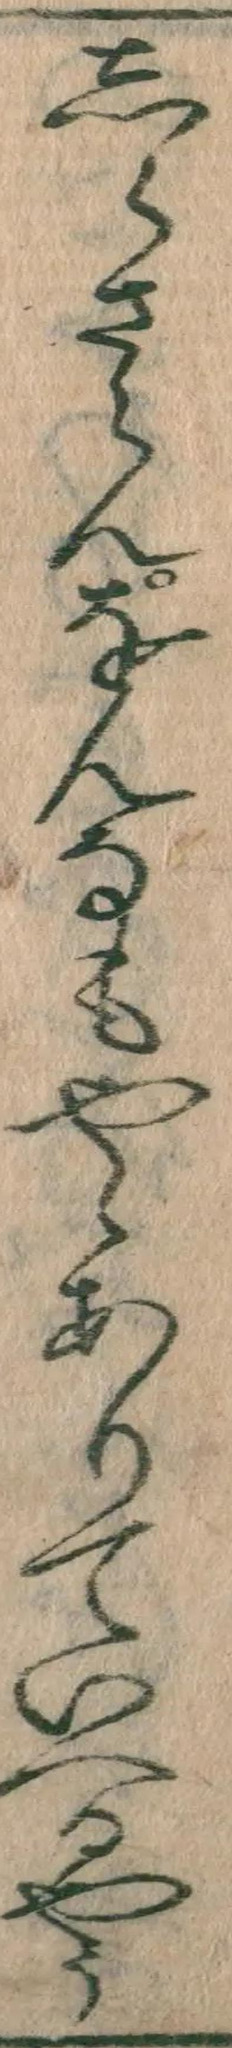しらさらん。をんなもやゝありていへるやう
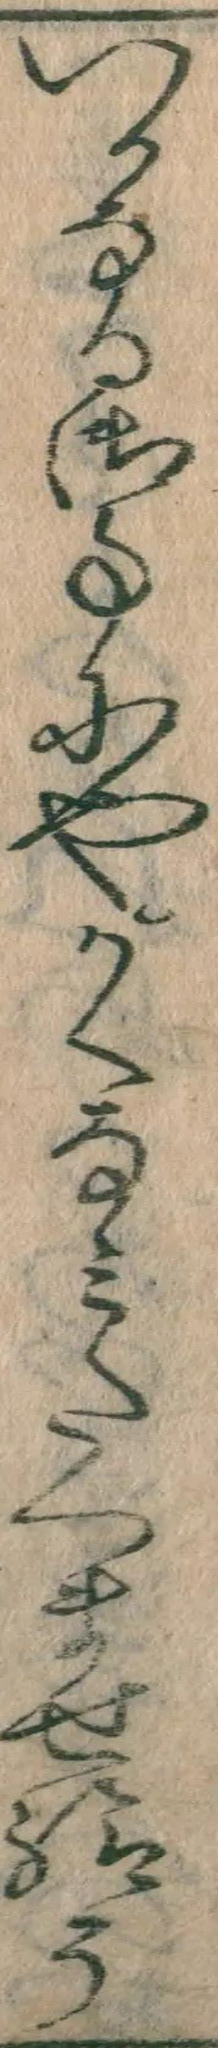いかなる御事にや。かくなみたくませ給そ
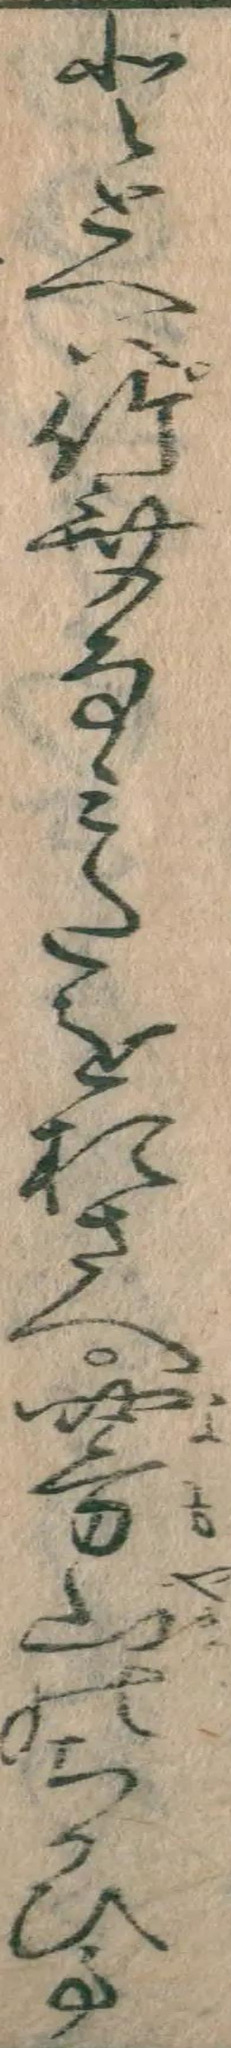ととへは。竹斎なみたをおさへ。四方山のちかひ事
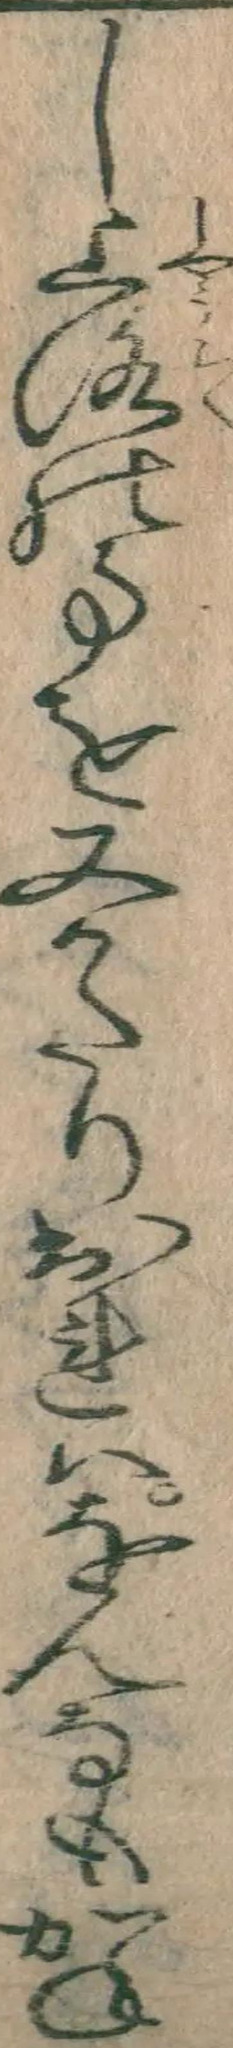し上洛の事を又かたり出れは。をんなもかね
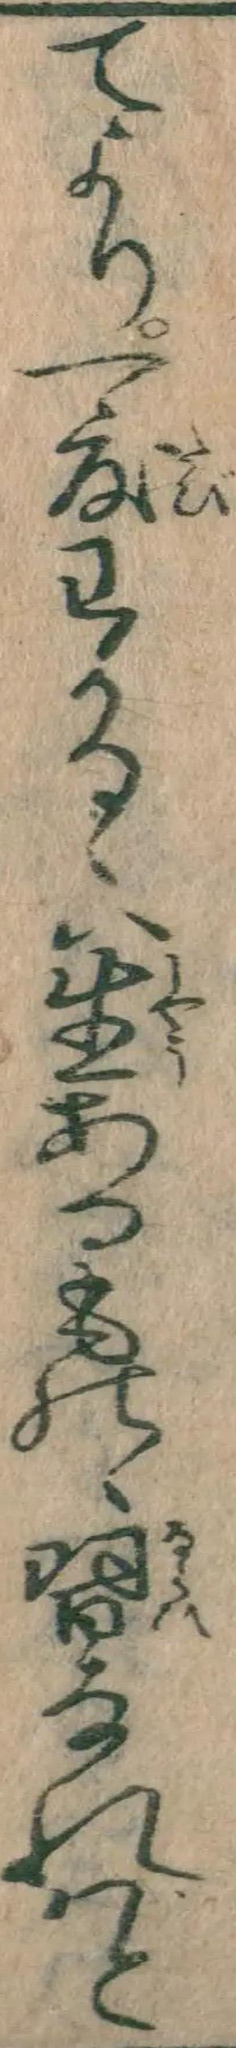てより。一度わかるゝは生あるものゝ習なれはと

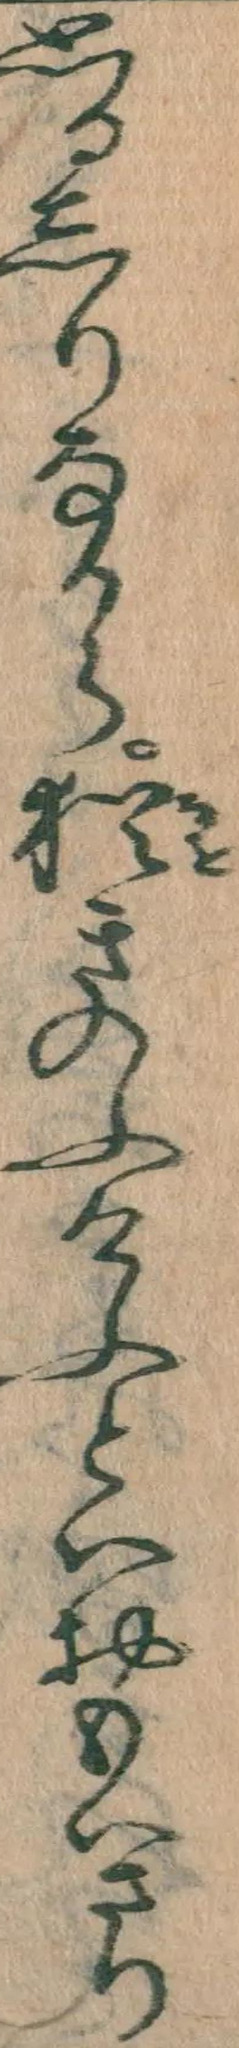思ひしりなから。猶きのふけふとはおもはさり
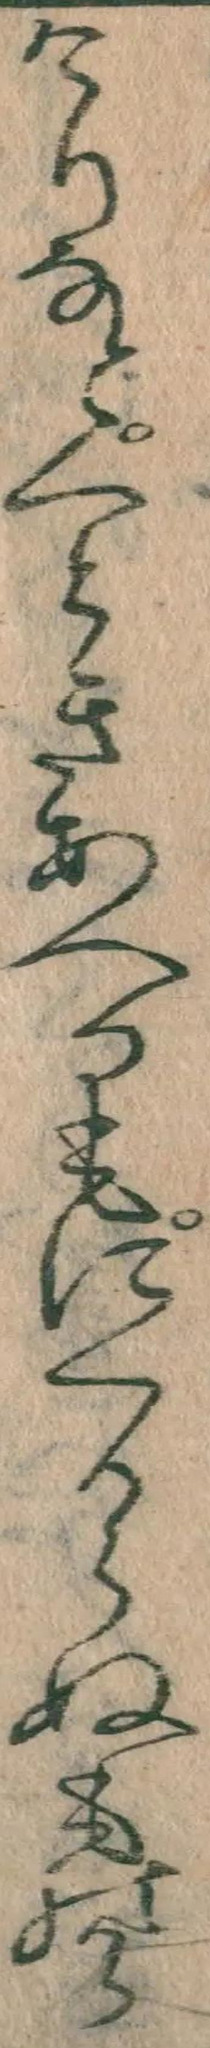けりなと。くときあへるも。にくからぬものから
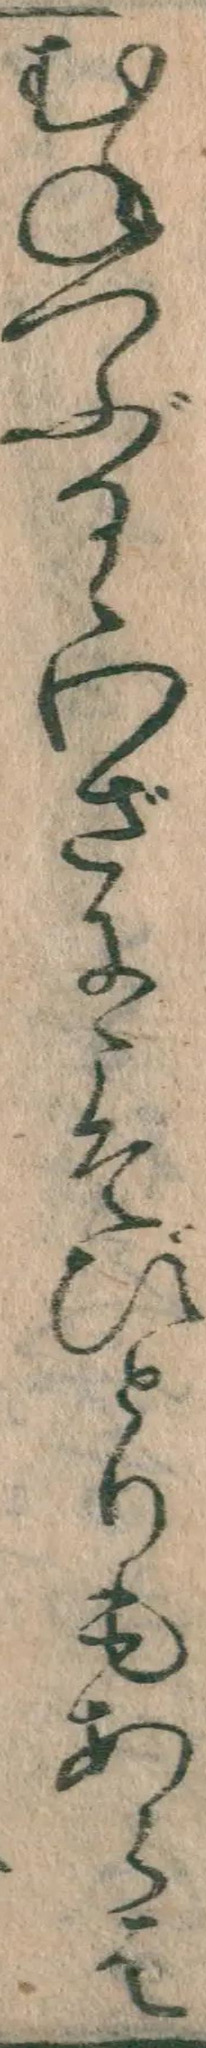むねつぶるゝわざにこそ。ひとりもあらは
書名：竹斎狂歌物語 3巻
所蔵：国立国会図書館 National Diet Library, JAPAN
